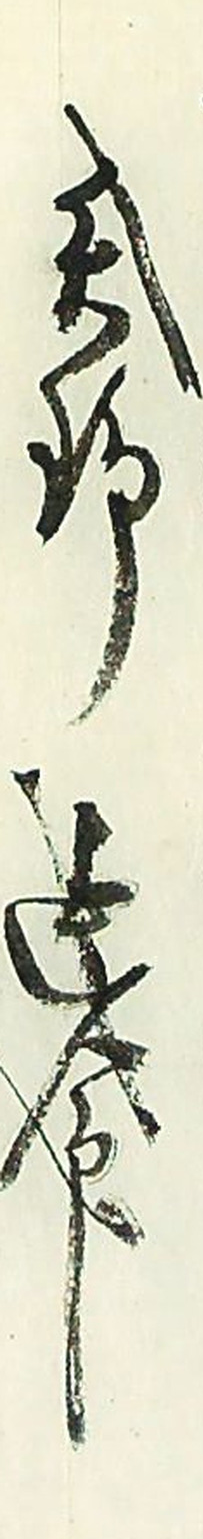矢野延命
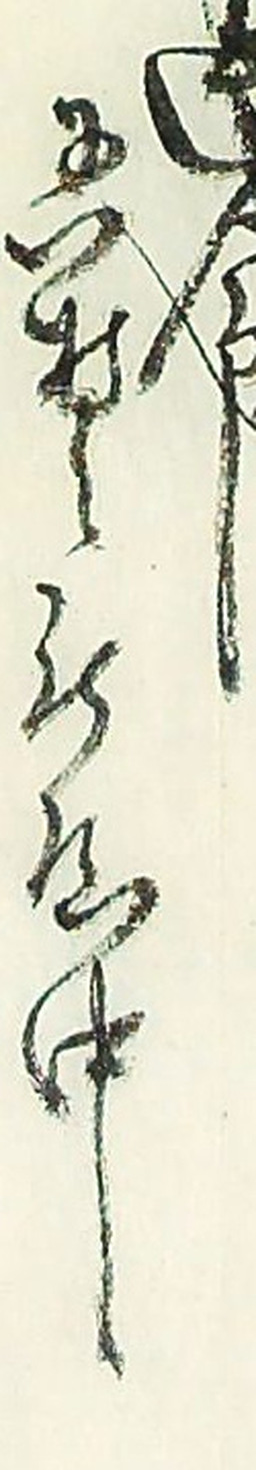右村々庄屋中
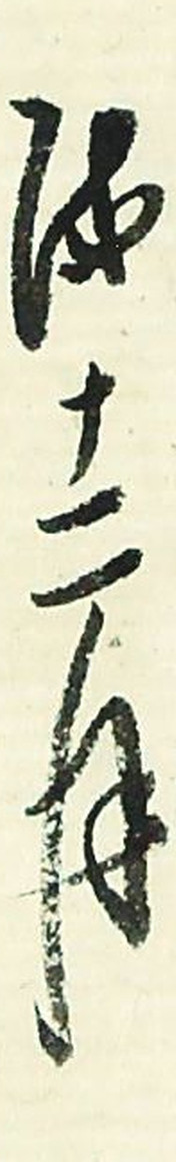戌十二月
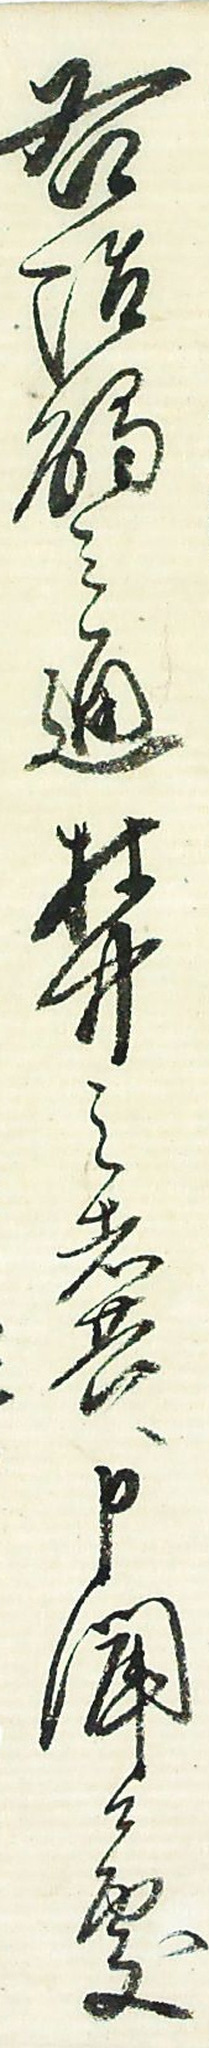右御触之通村中の者共へ申聞候処
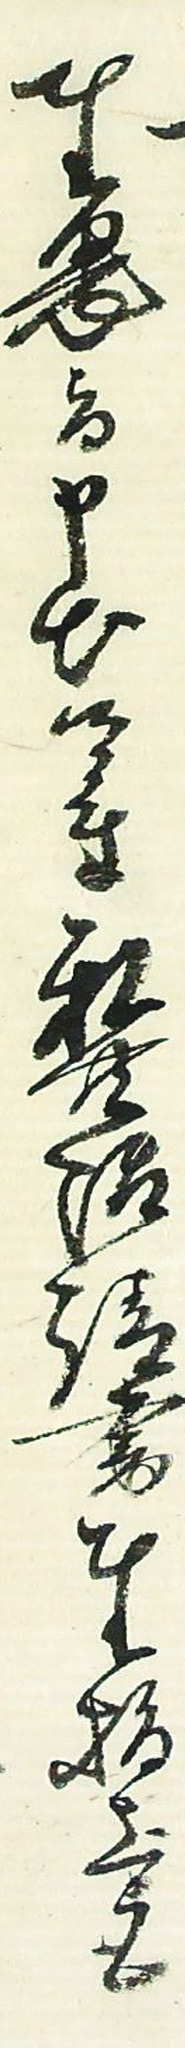奉畏旨申出候に付私共御請書奉指上候以上
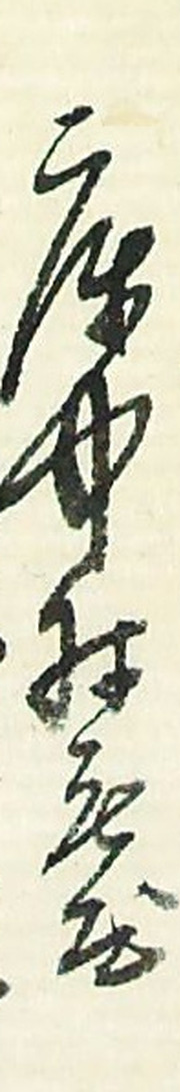府中村庄屋
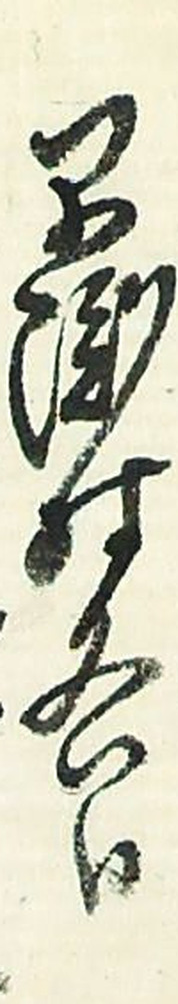和田村右同
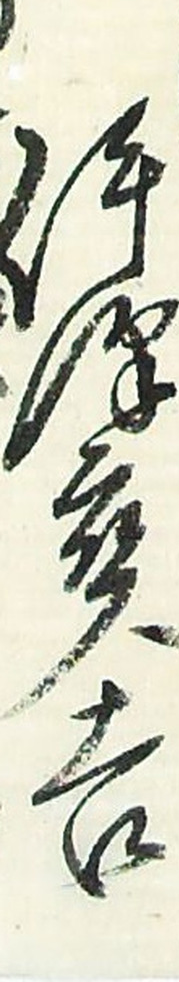伊澤宝吉
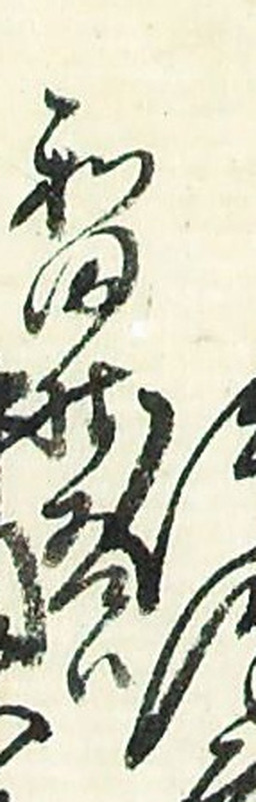和田村右同
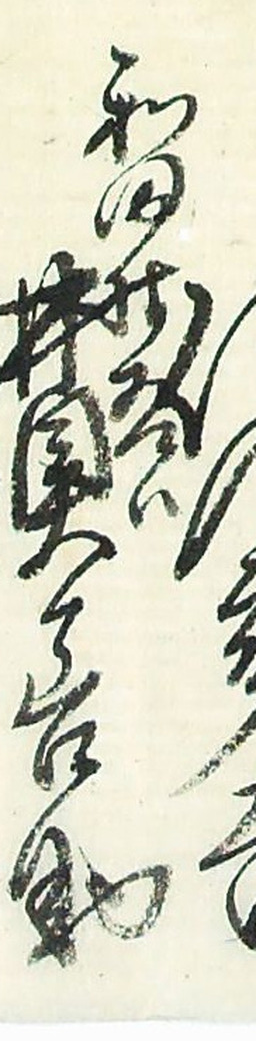井貝善助
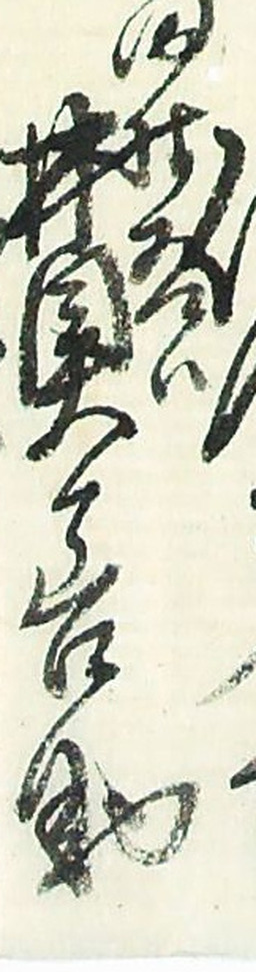井貝善助
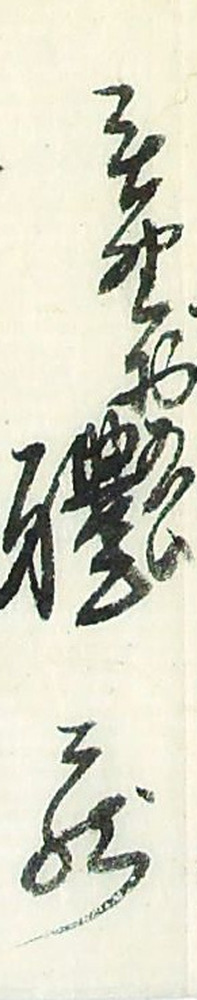矢野村右同
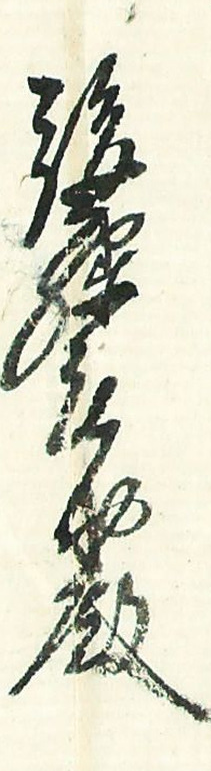後藤庄助殿
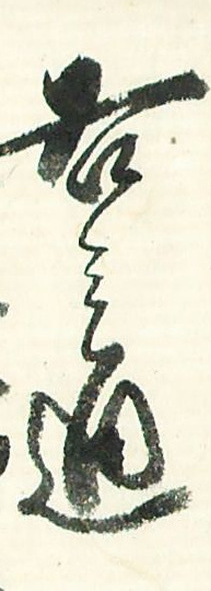右之通
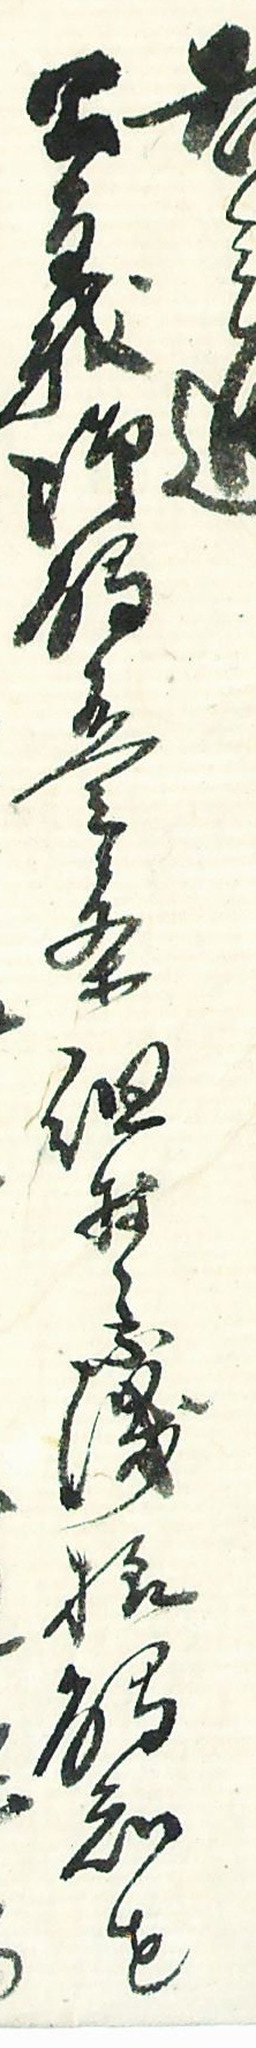公義御触有之候条組村々不洩様触知せ
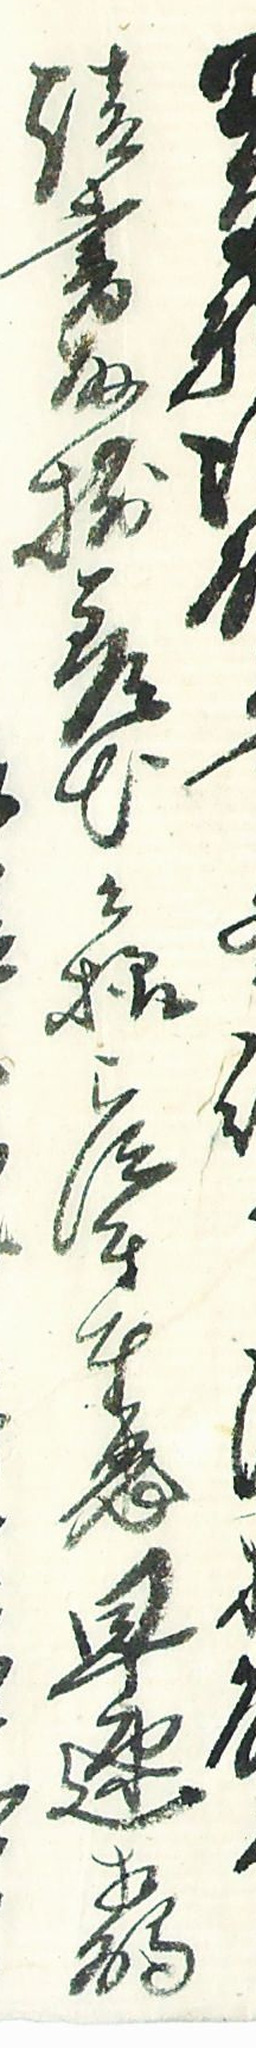請書取揃差出候様被仰付奉畏早速相触
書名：諸御用御□受書控
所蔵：鳴門教育大学 Naruto University of Education
